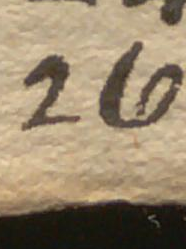26
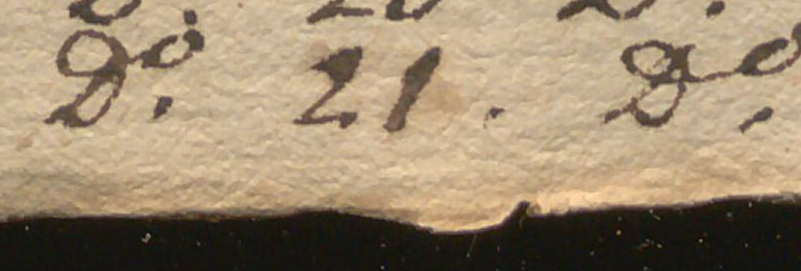D^o. 21. D^o.
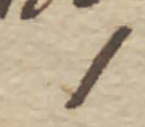1
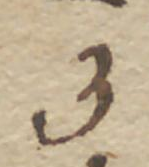3
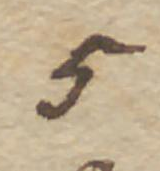5
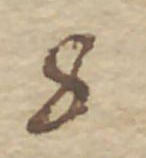8
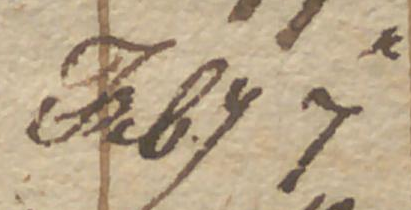Feb^y 7^th
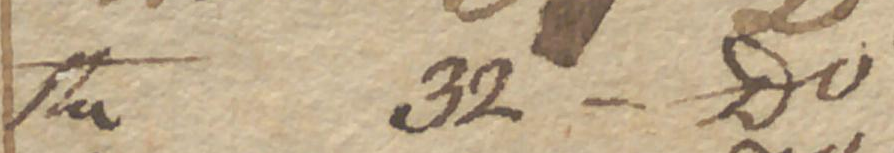the 32- D^o.
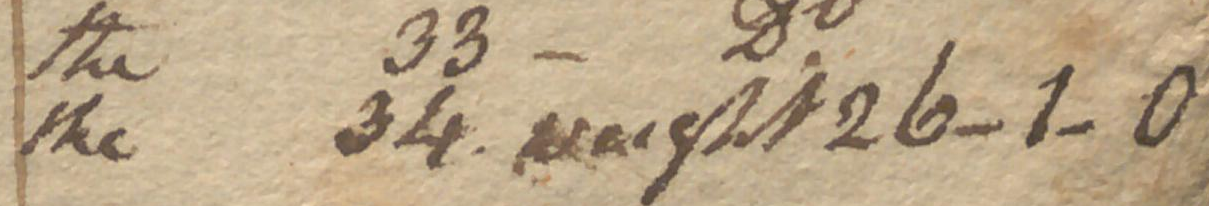the 34. weight 26.1.0
